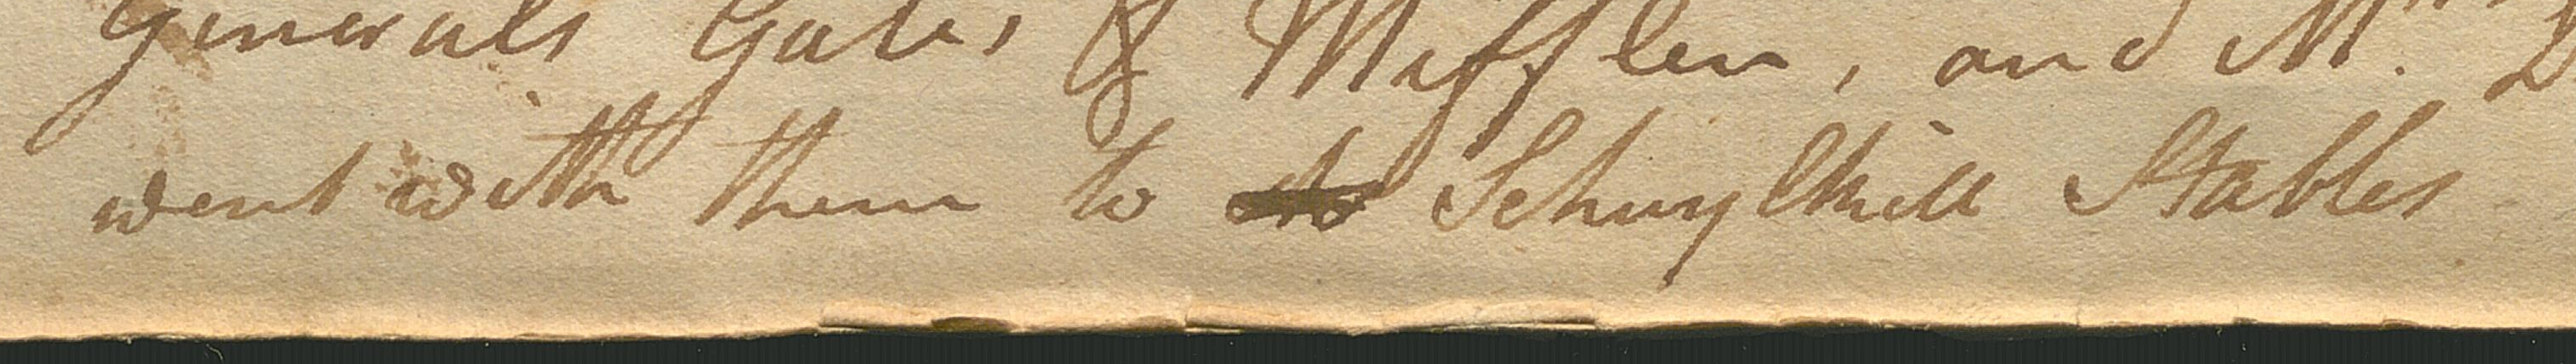went with them to ato^r Schuylkill Stables
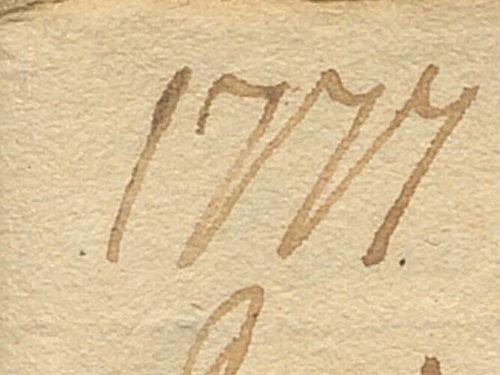1777
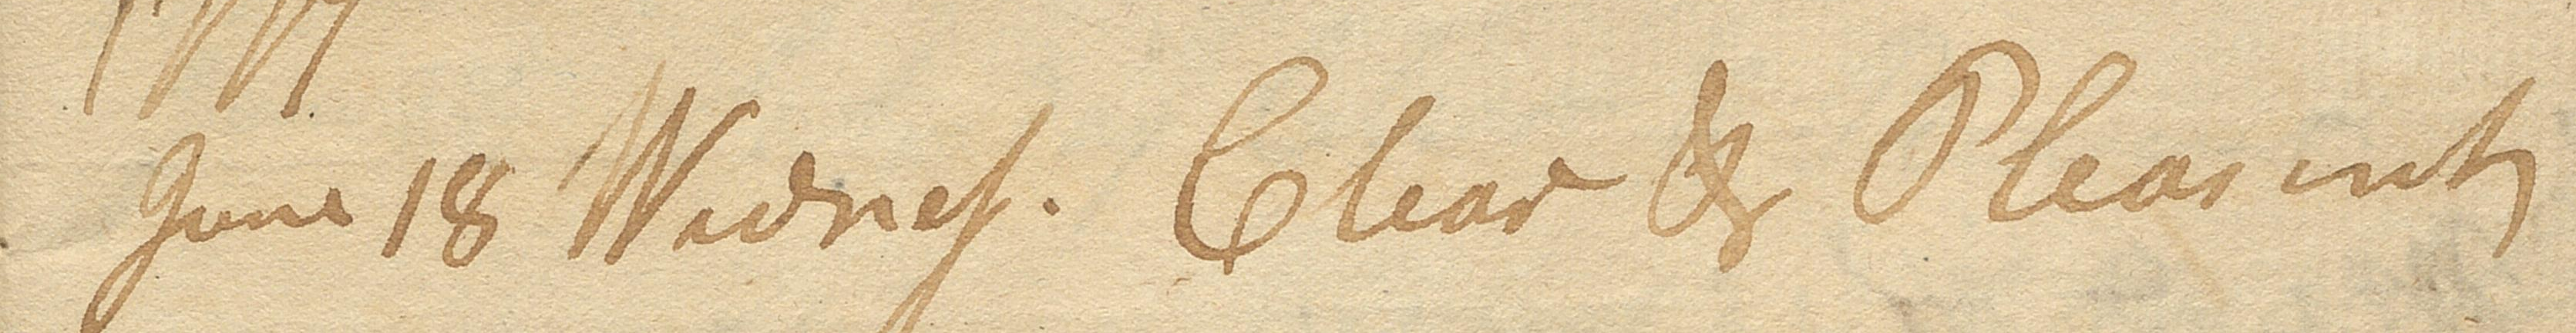June 18 Wednes. Clear & Pleasent
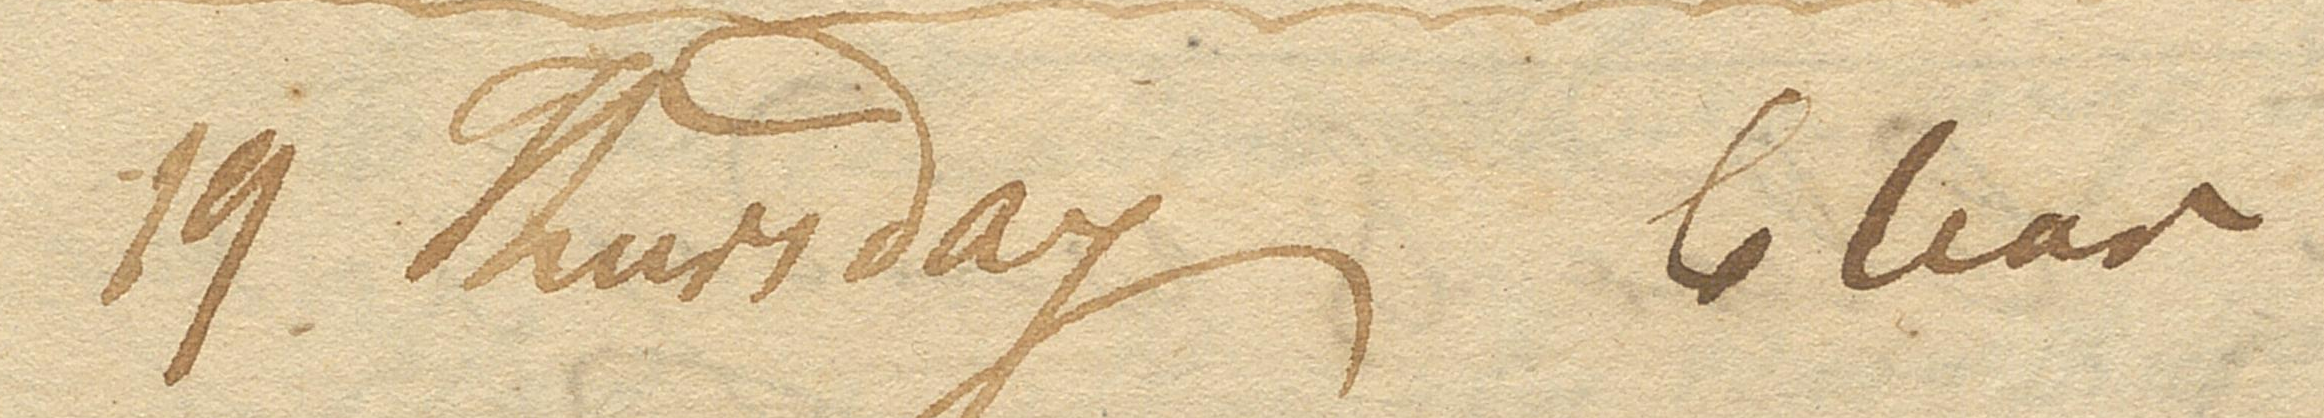19 Thursday Clear
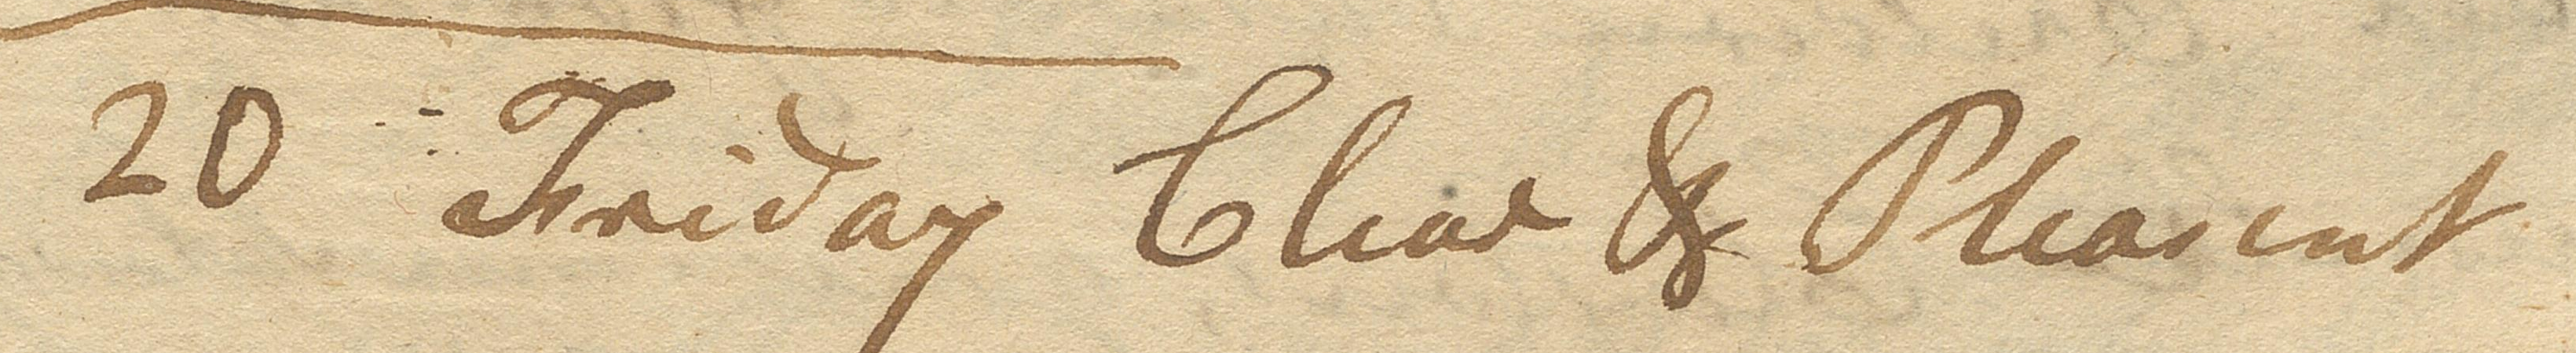2 Friday Clear & Pleasent
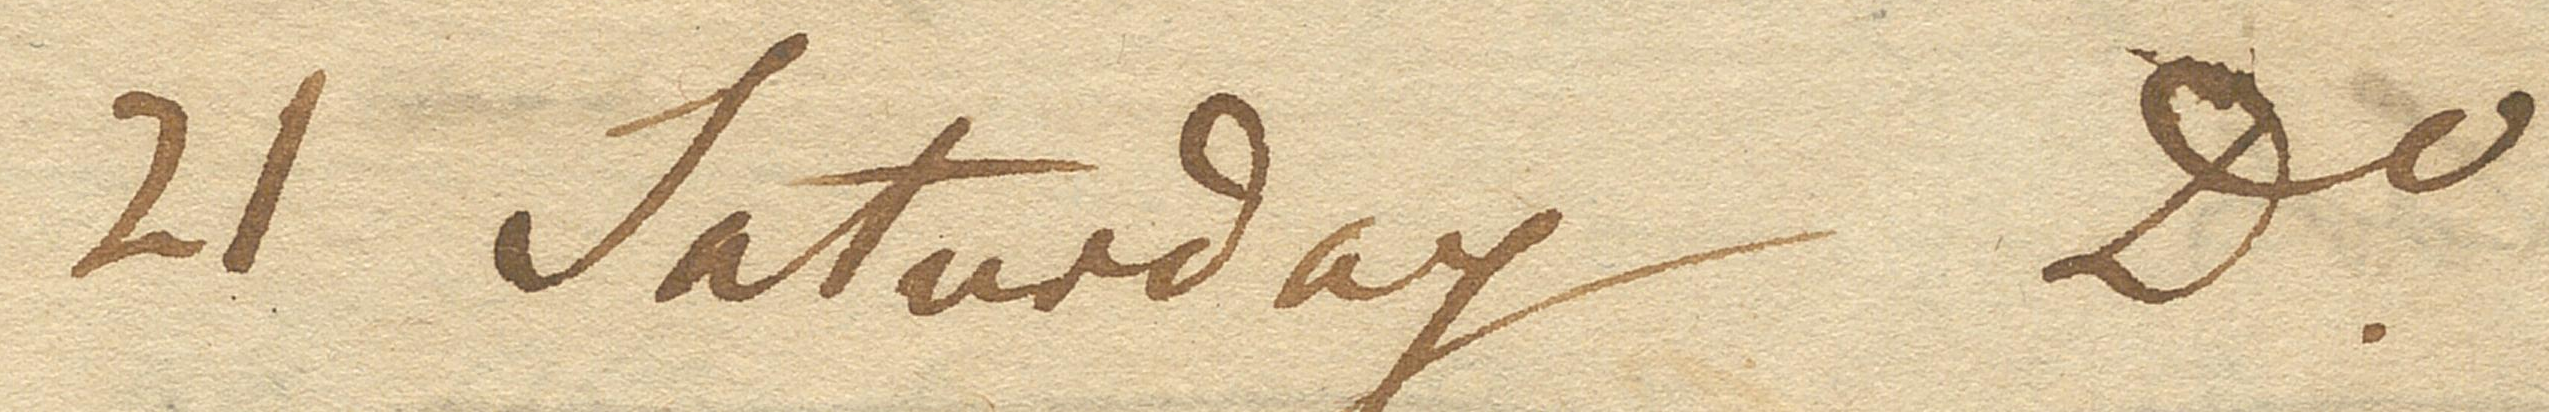21 Saturday D^o.
